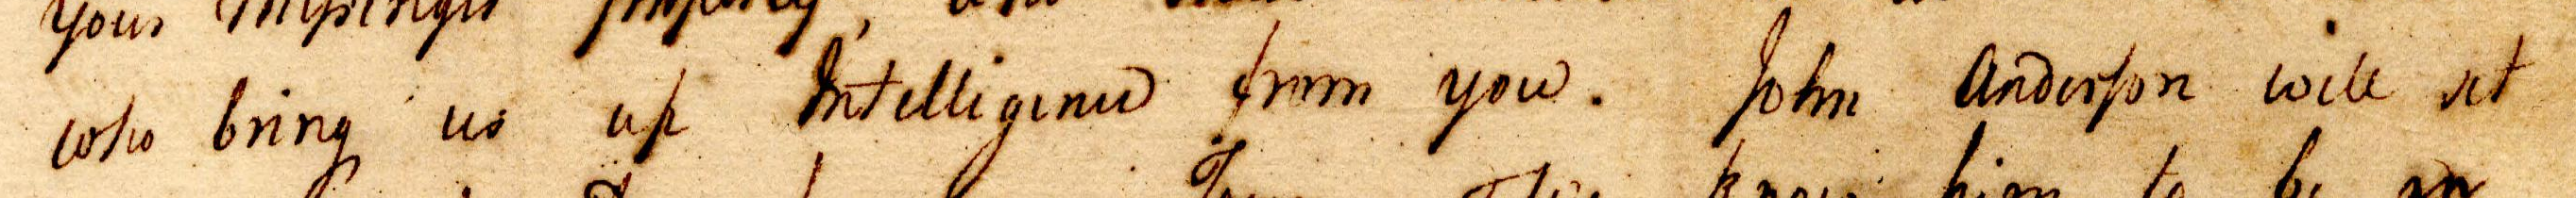who bring us up Intelligence from you. John Anderson will set
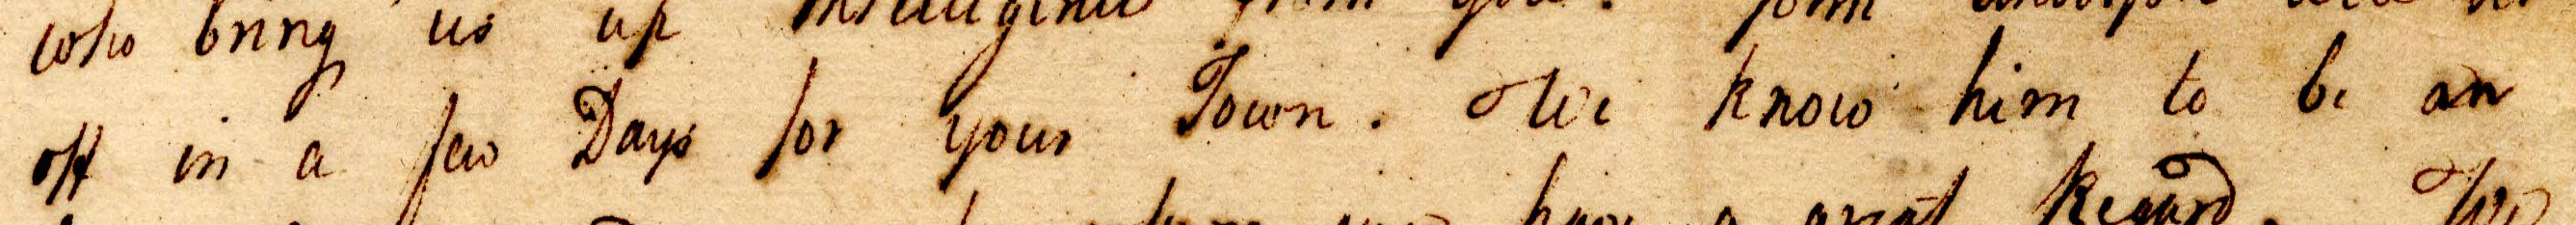off in a few Days for your Town. We know him to be an
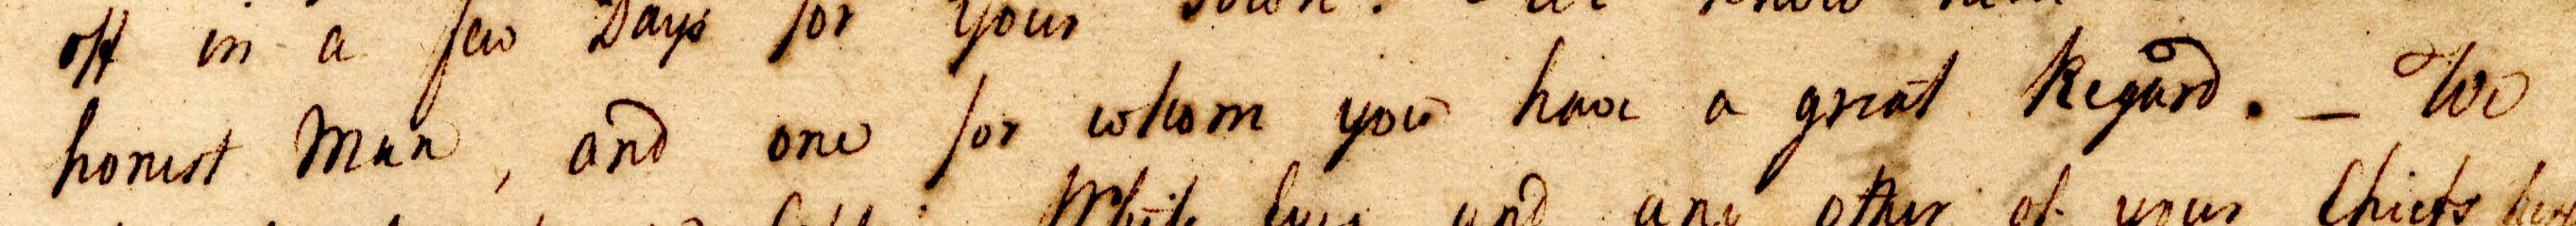honest Man, and one for whom you have a great Regard.- We
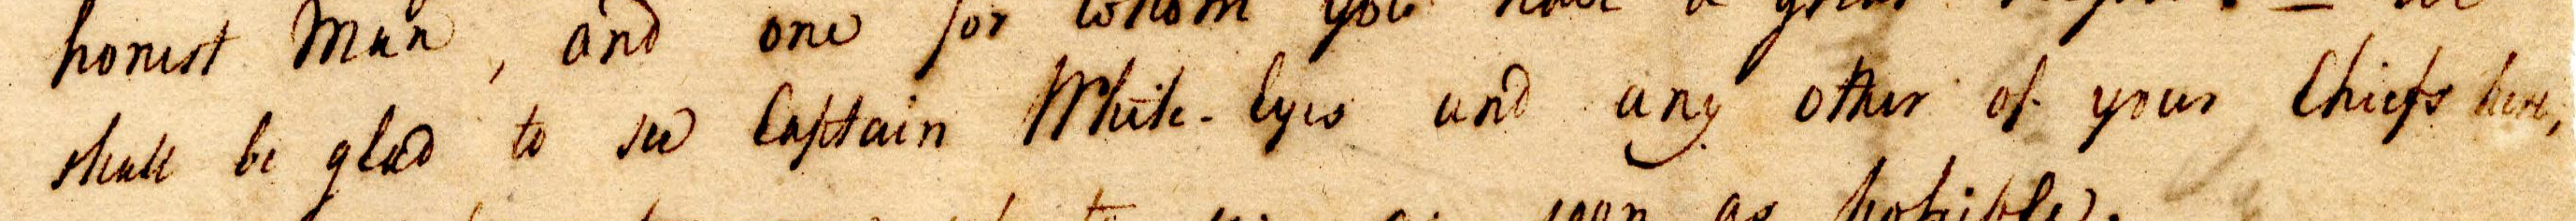shall be glad to see Captain White- Eyes and any other of your Chiefs here,
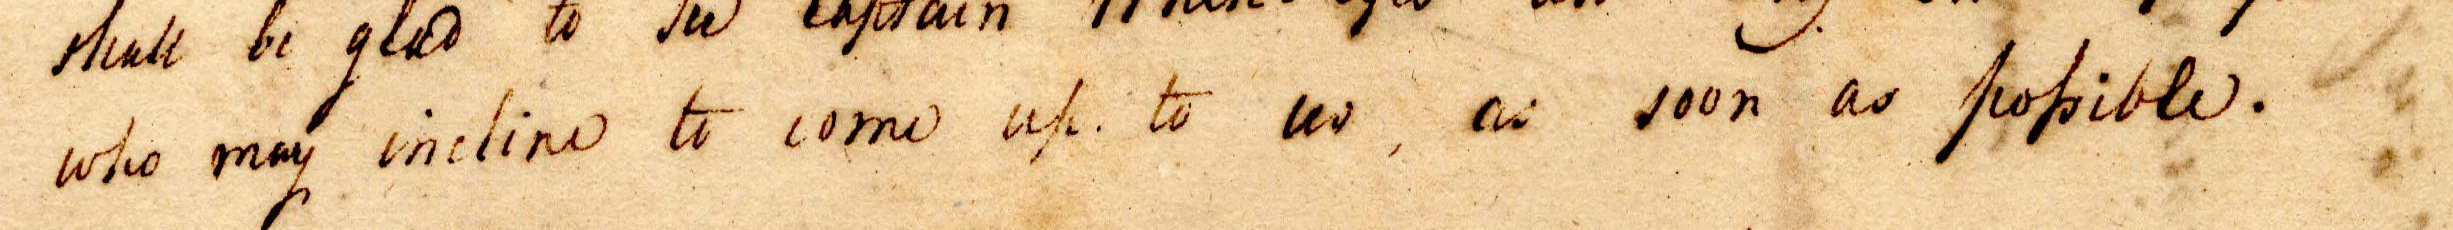who may incline to come up to us as soon as possible.
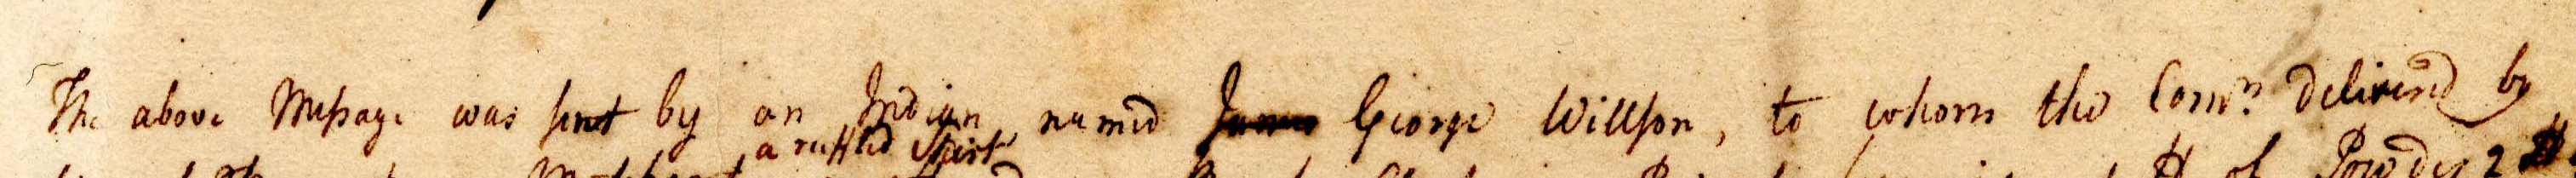The above Message was sent by an Indian named [____] George Willson, to whom the Com^r. deliver'd by
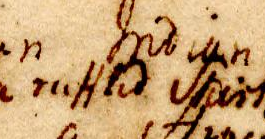ruffled shirt
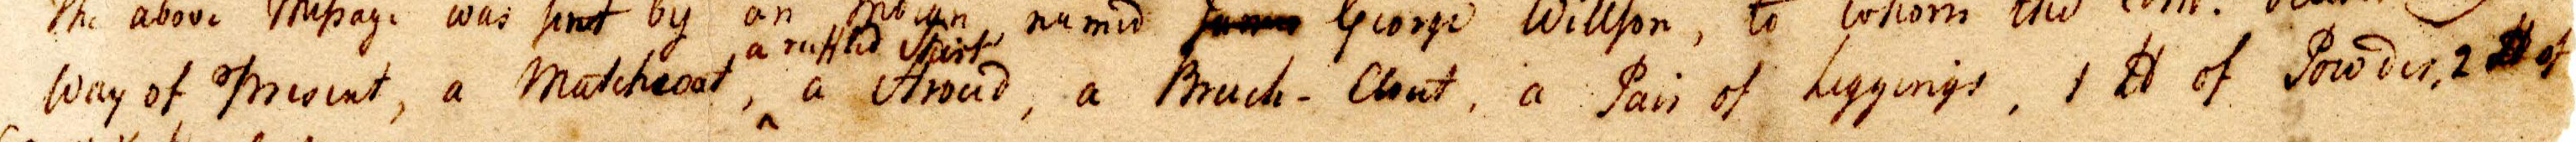way of present a Matchcoat, a ^ Stroud, a Bruch-Clout, a Pair of Leggings, 1 Lb of Powder, 2 Lb of
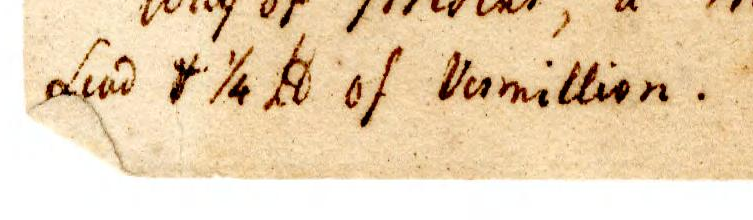Lead & 1/4 Lb of Vermillion.
